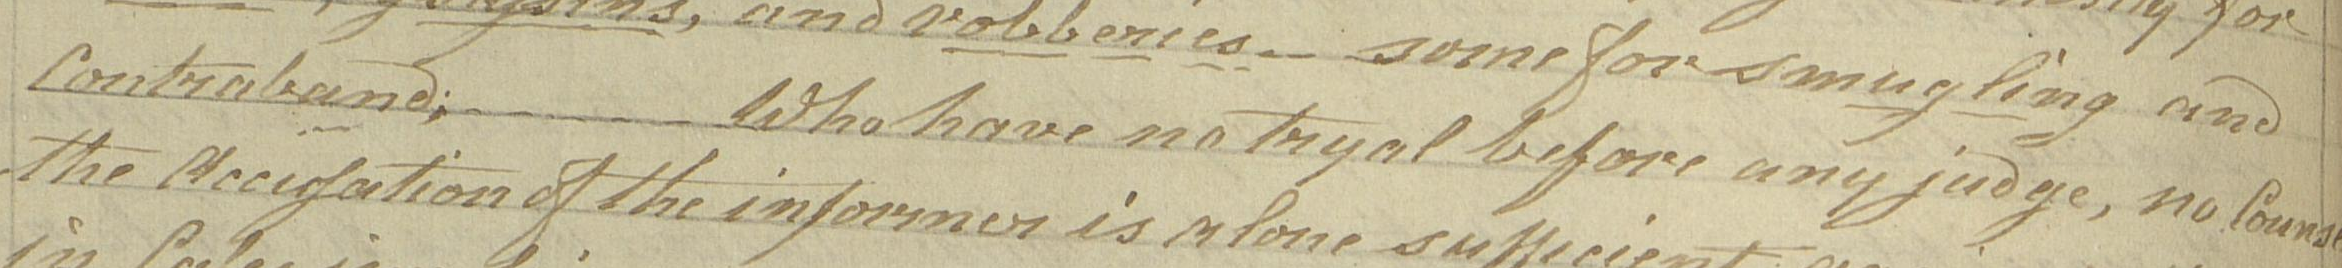Contraband; Who have no tryal before any judge, no Counsel
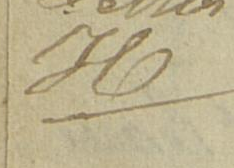H
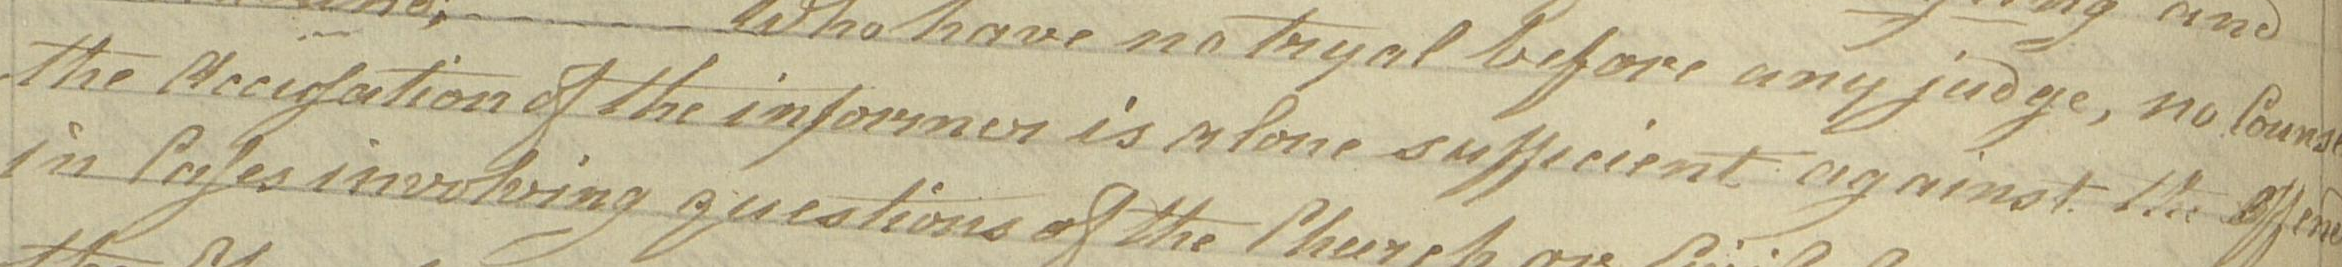The Accusation of the informer is alone sufficient against the Offend-
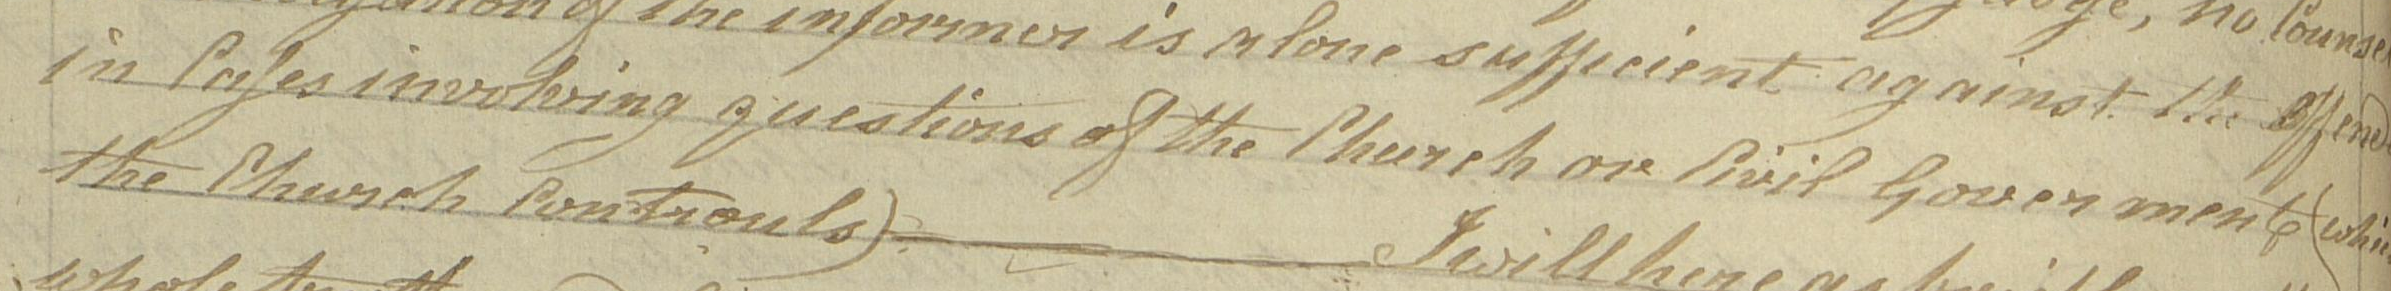in Cases involving questions of the Church or Civil Government (which
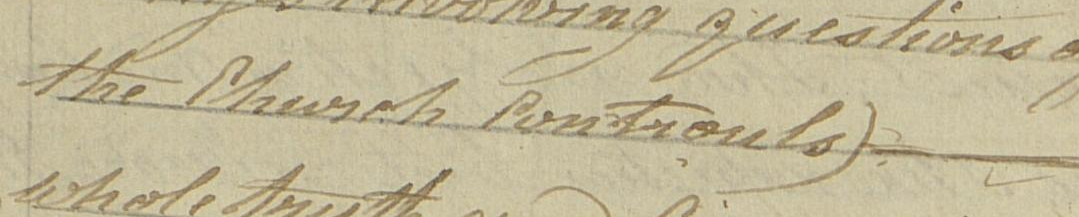the Church controls)
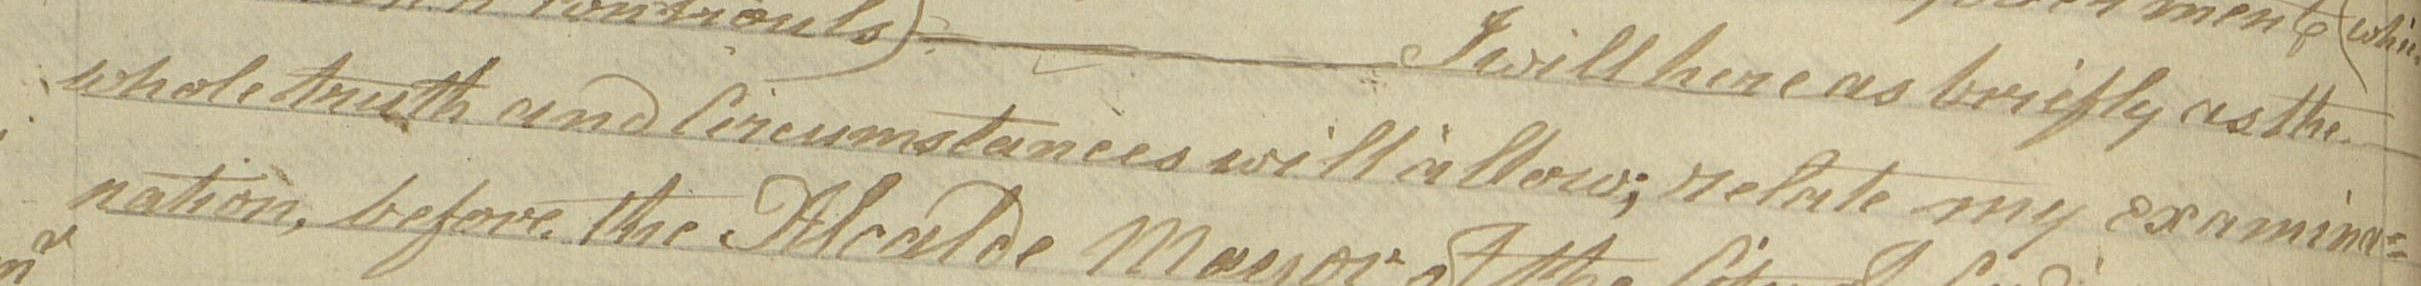whole truth and Circumstances will allow; relate my examin-
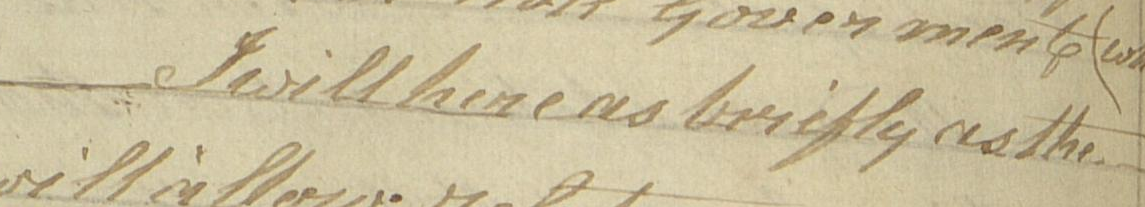I will here as briefly as the
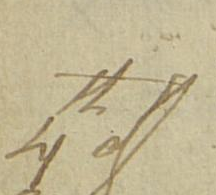4^th of
